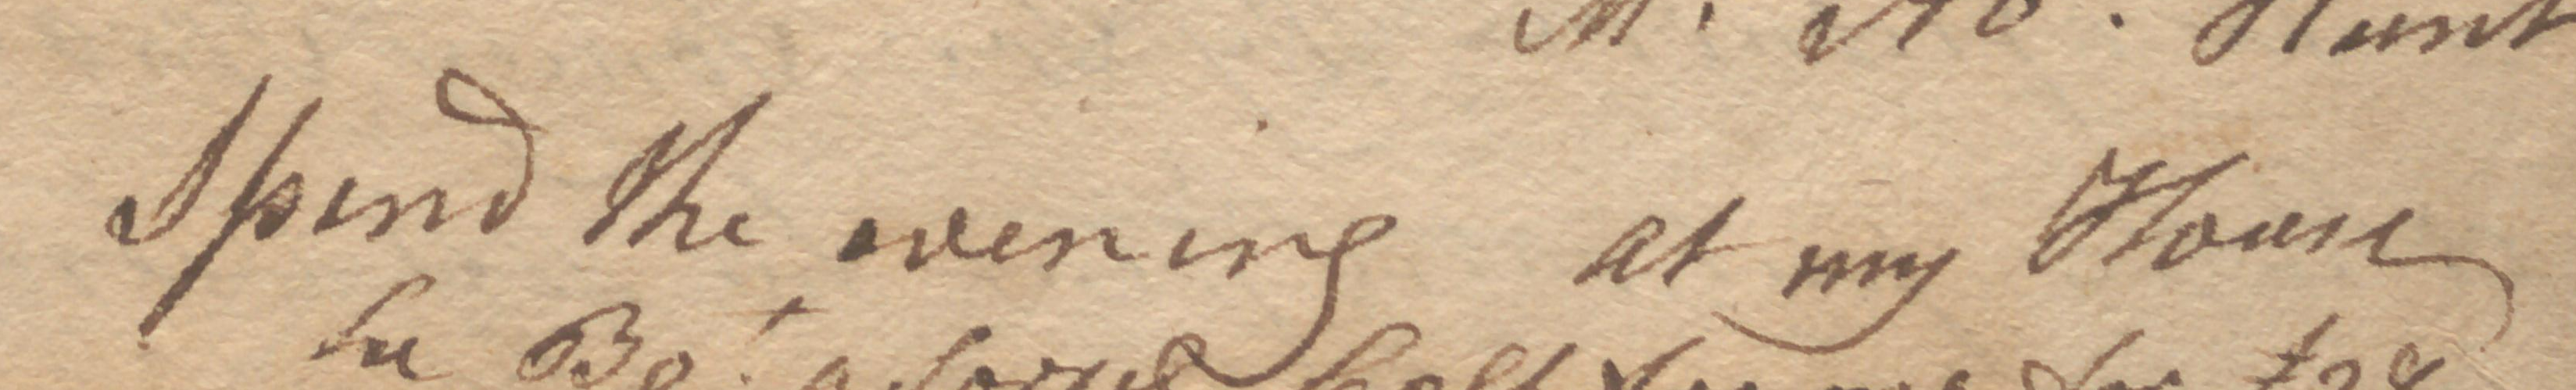spend the evening at my Home
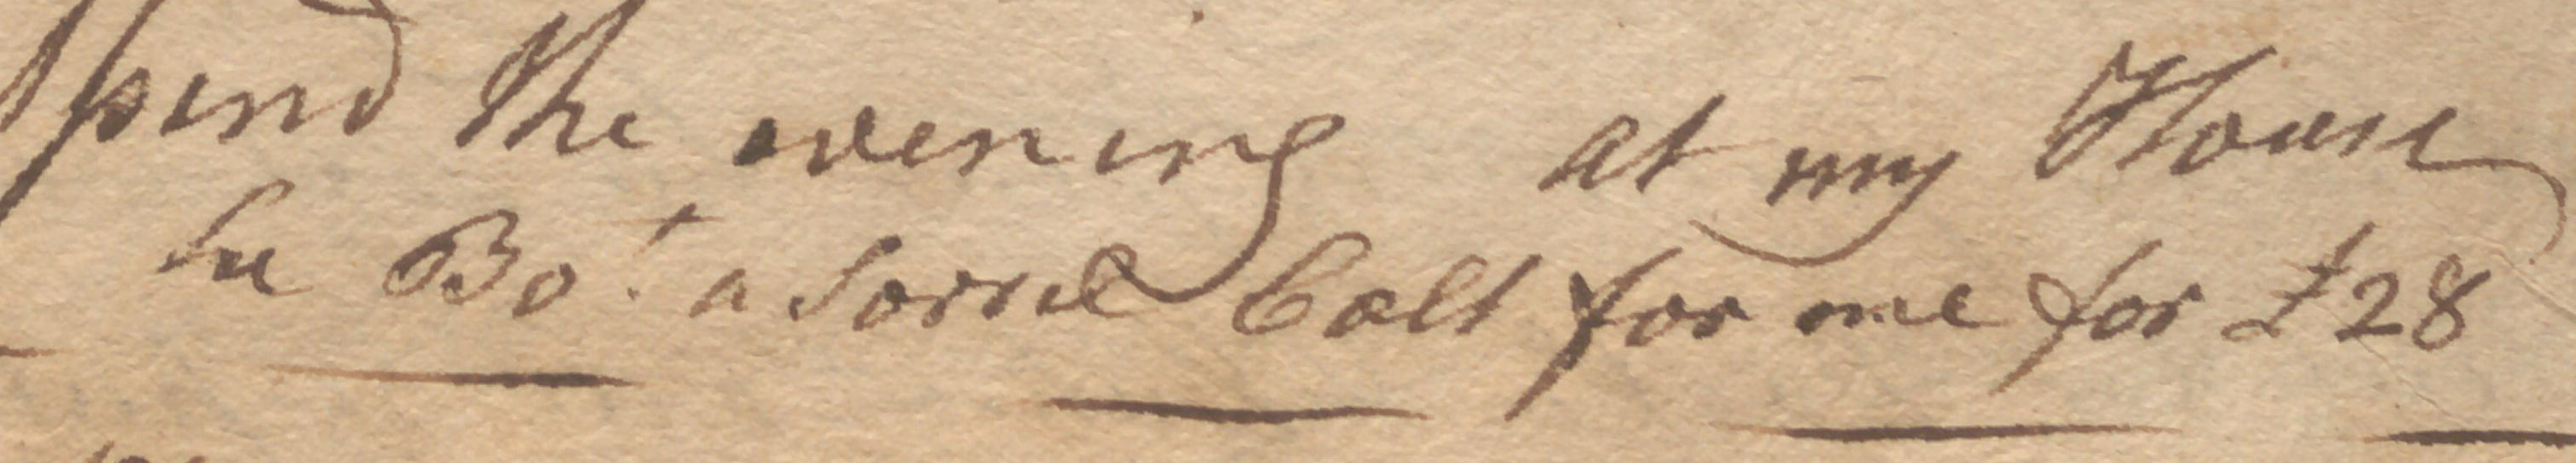he Bo^t. a sorrel Colt for me for £28
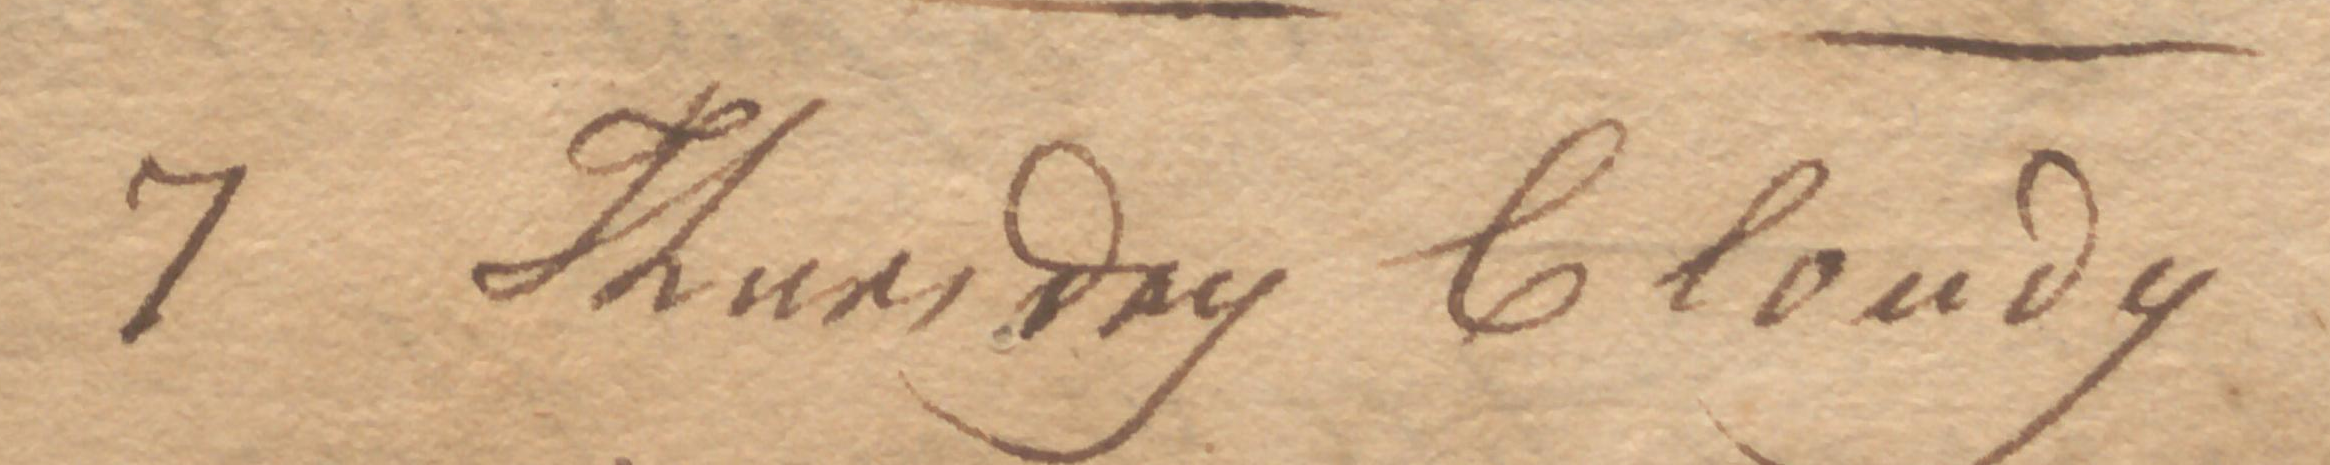7 Thursday Cloudy
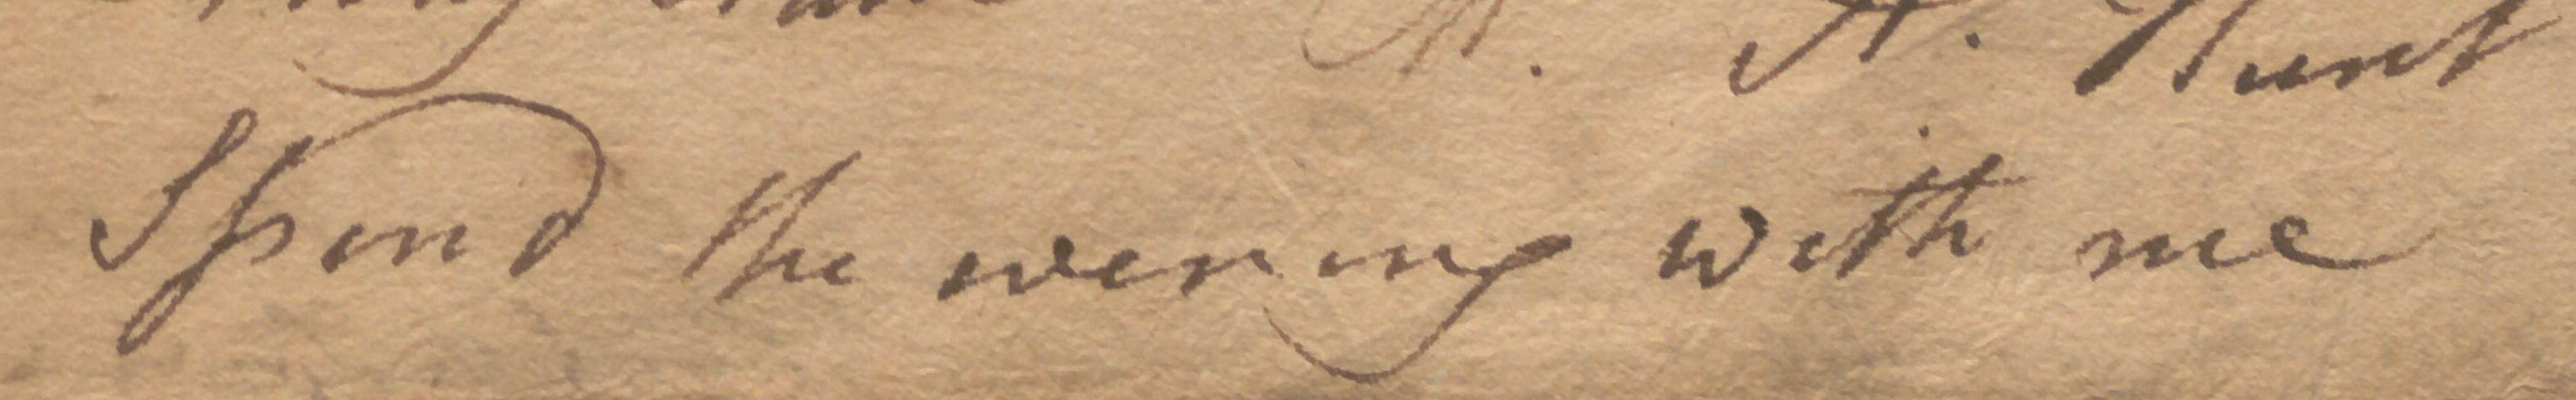spend the evening with me
